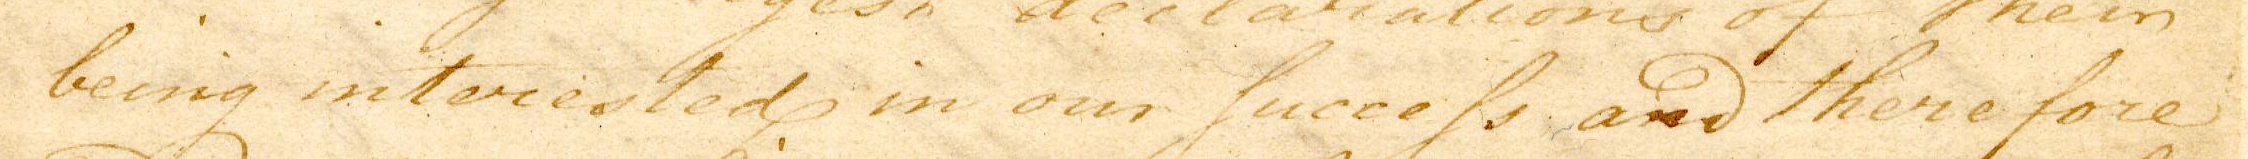being interested in our success, and therefore
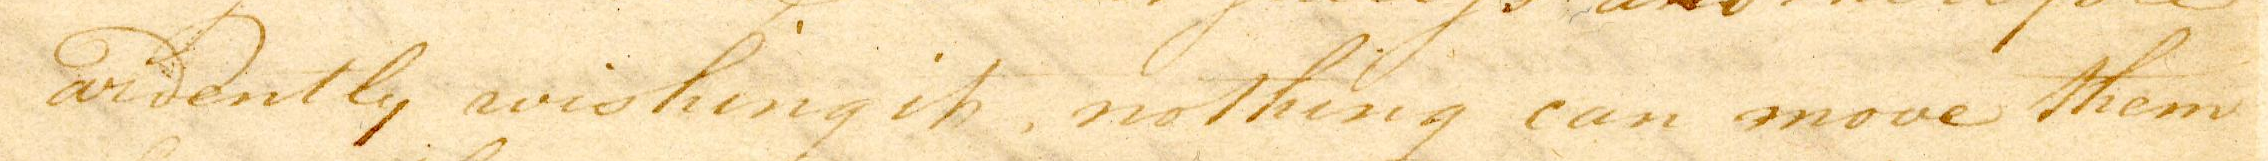ardently wishing it, nothing can move them
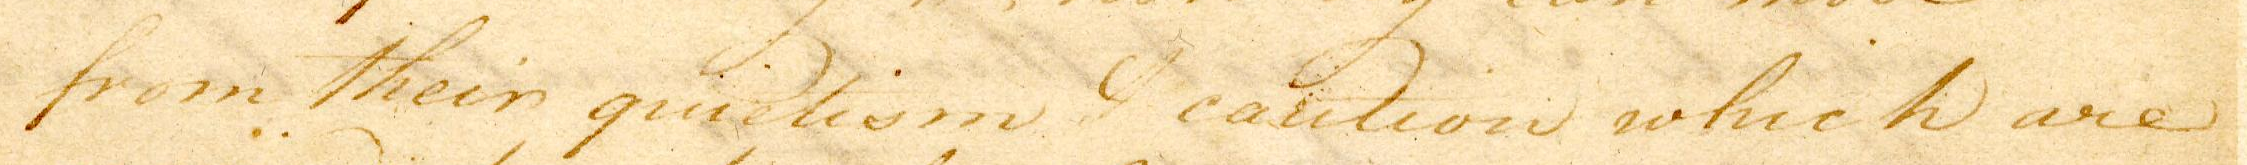from their question & caution which are
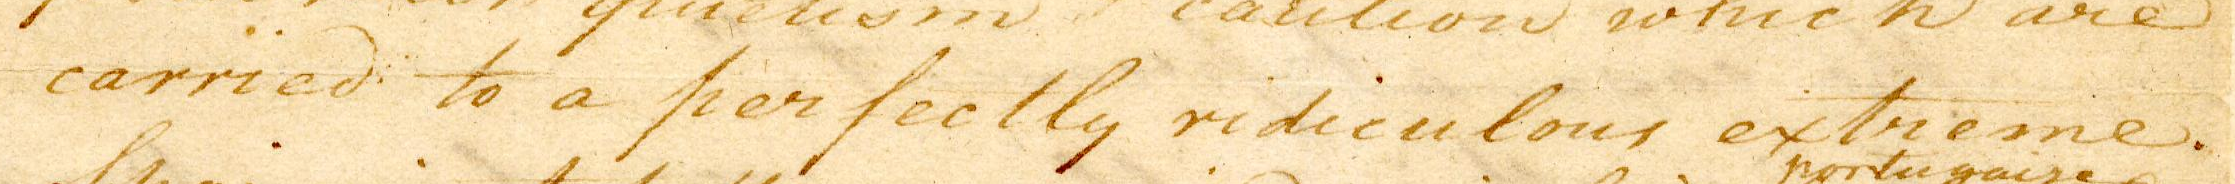carried to a perfectly ridiculous extreme.
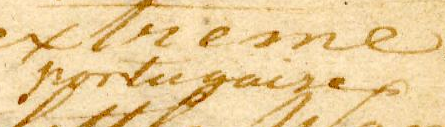portugaise
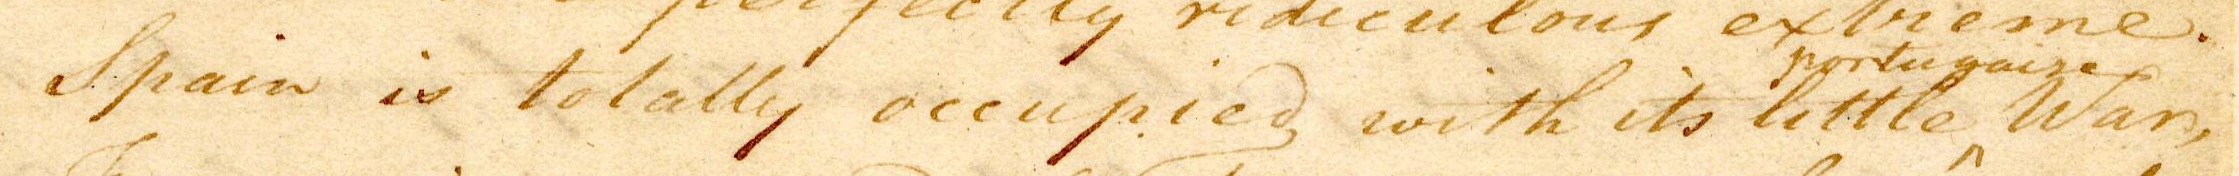Spain is totally occupied, with its little ^ War
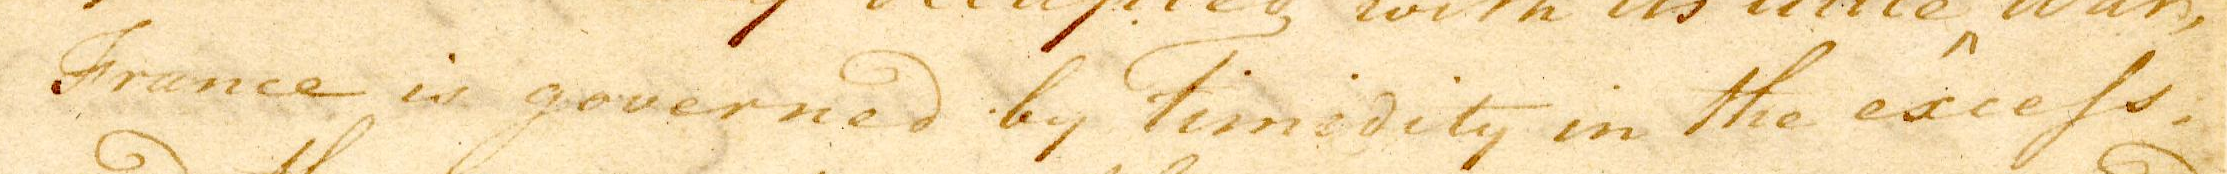France is governed by timidity in the excess.
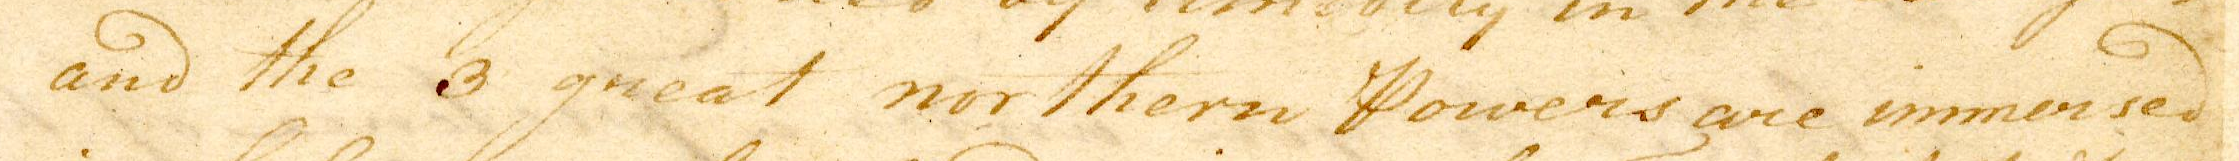and the 3 great northern powers are immersed
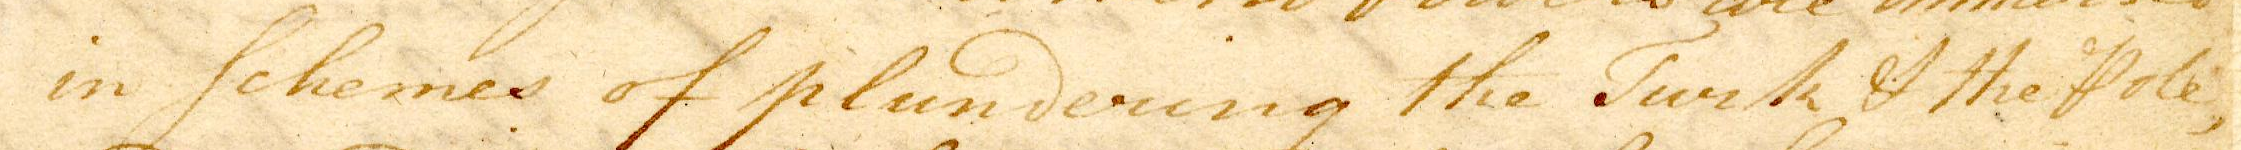in Schemes of plundering the Turk & the Pole,
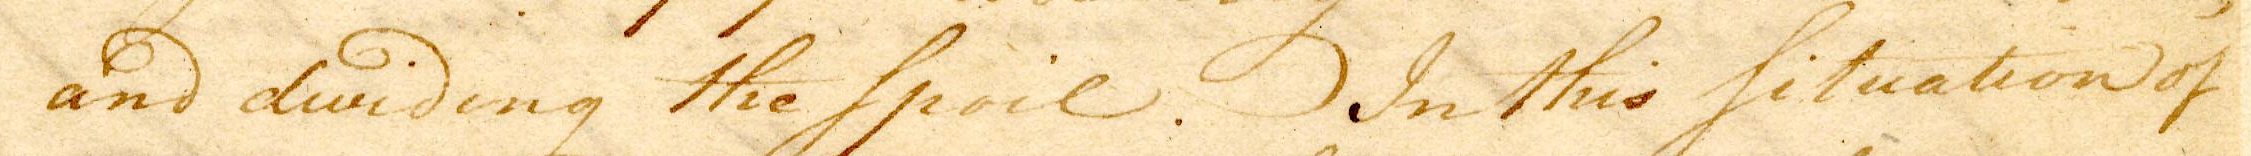and dividing the Spoil. In this situation of
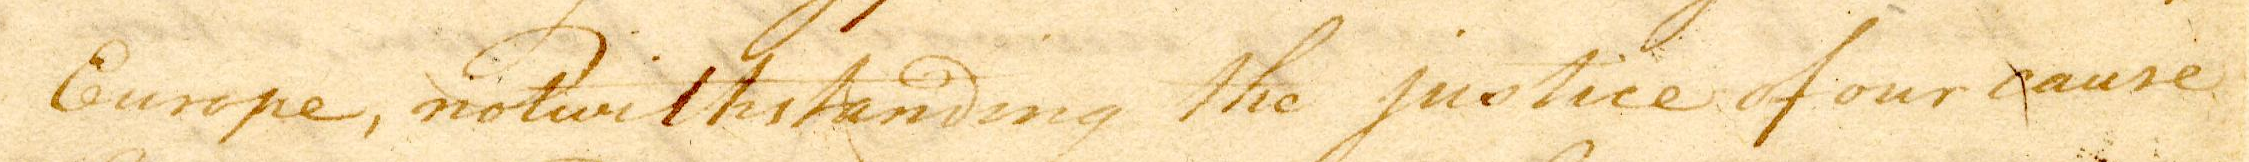Europe, notwithstanding the justice of our cause
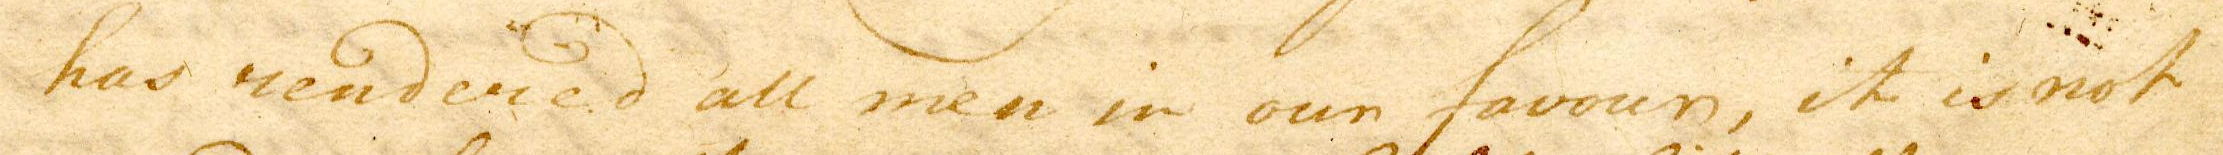has rendered all men in our favour, it is not
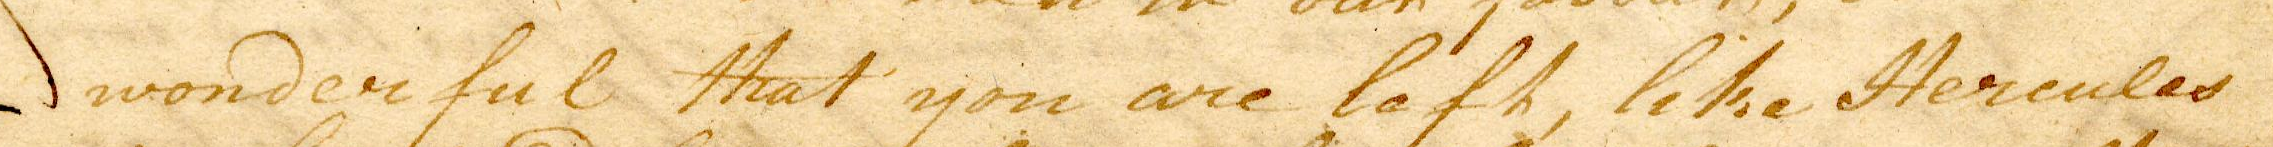wonderful that you are left, like Hercules
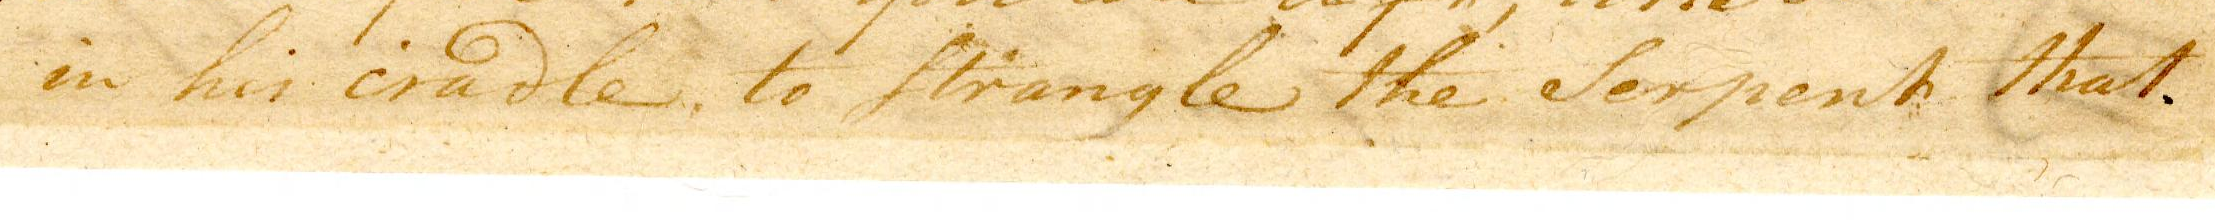in his cradle, to strangle the Serpent that
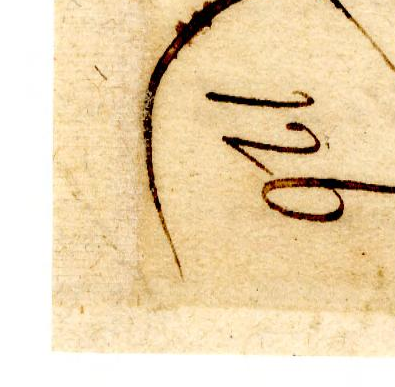126
